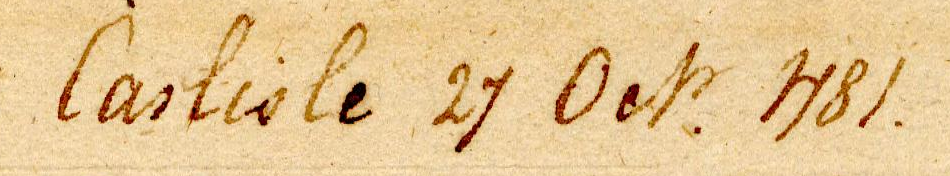Carlisle 27 Oct^r. 1781.
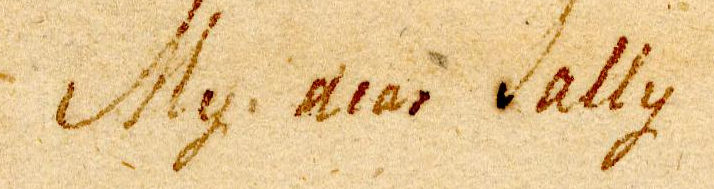My dear Sally
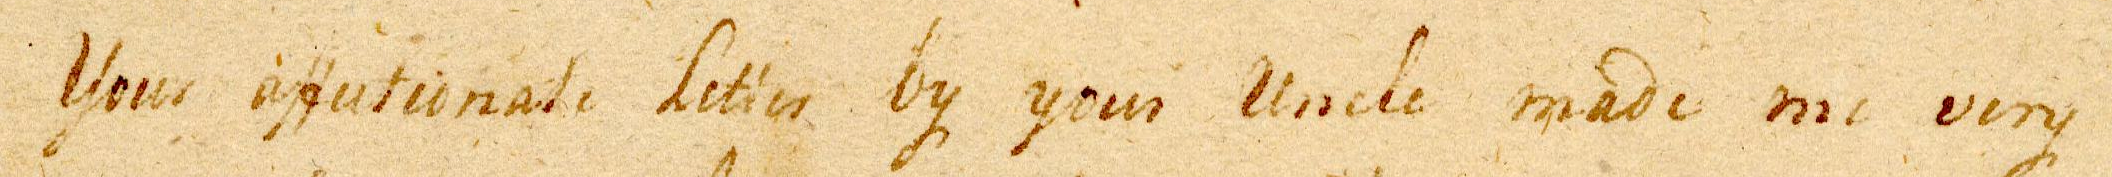Your affectionate Letter by your Uncle made me very
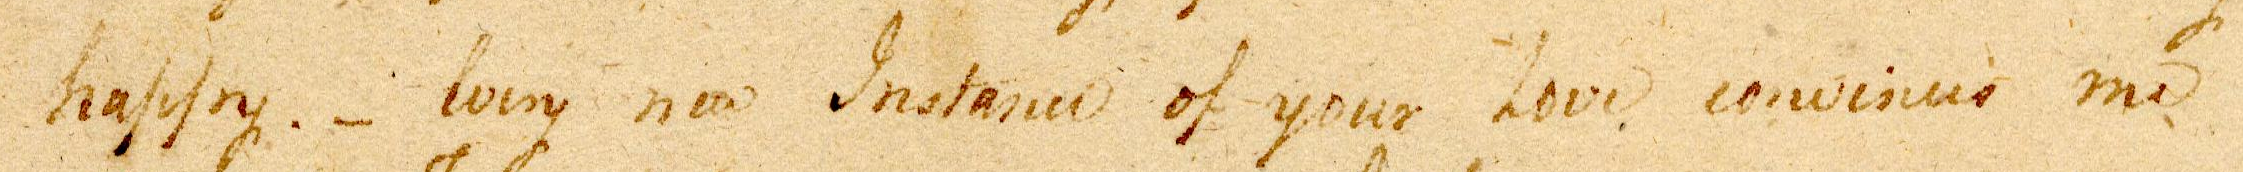happy. Evey new Instance of your Love convinces me
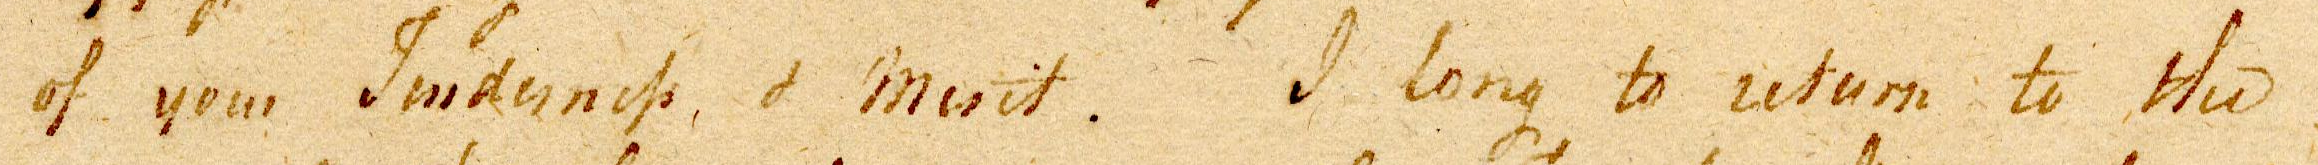of your Tenderness & Merit. I long to return to the
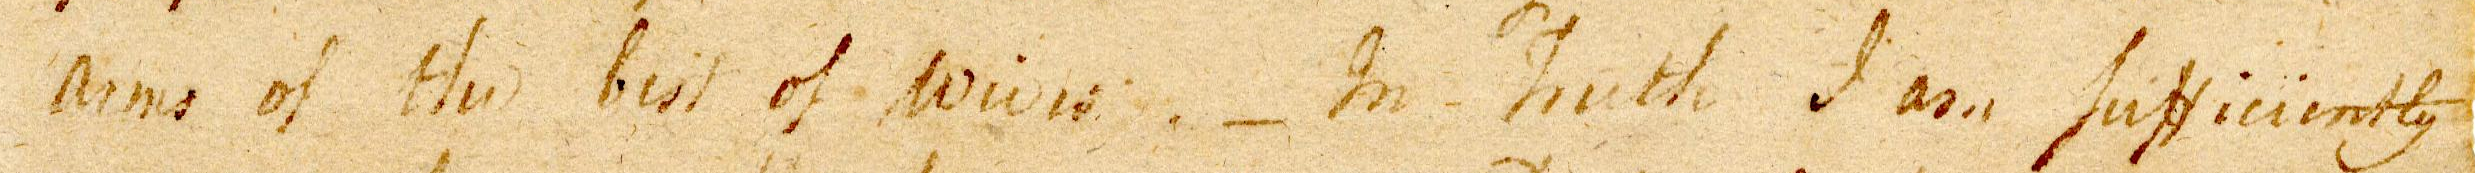arms of the best of Wives. In truth I am sufficiently
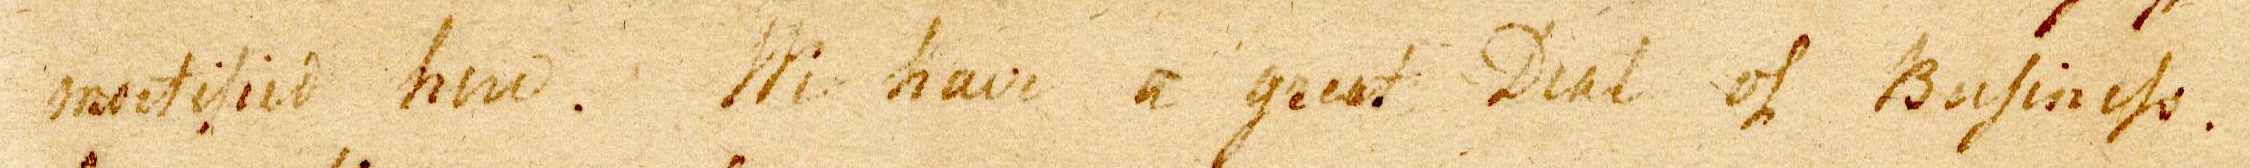mortified here. We have a great Deal of Business
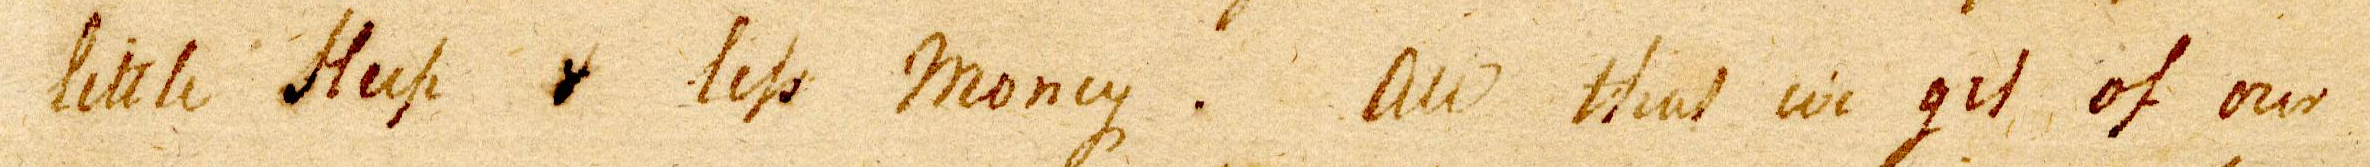little Sleep & less Money. All that we get of our
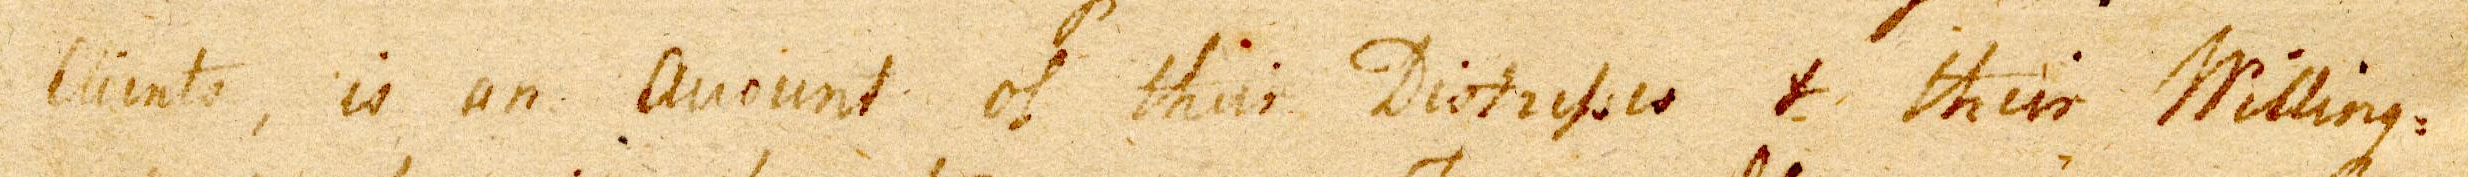Clients is an Account of their Distresses & their Willing-
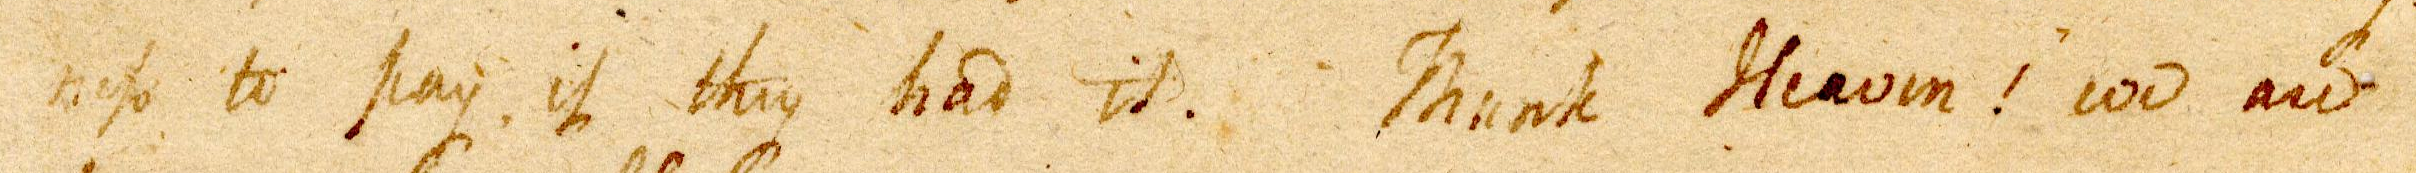-ness to pay if they had it. Thank Heaven! we are
